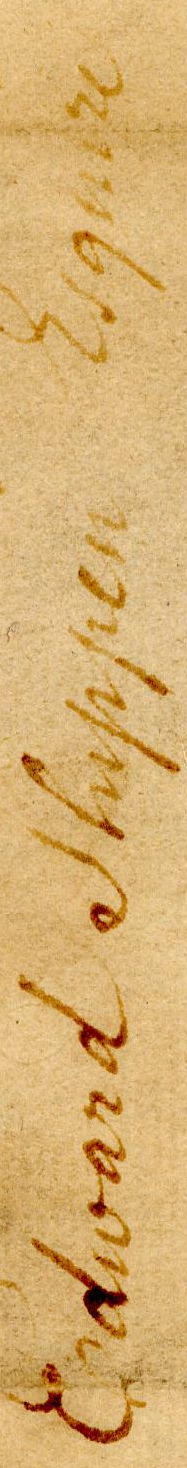Edward Shippen Esquire
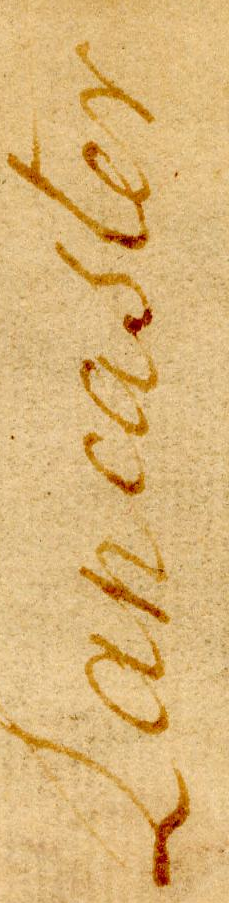Lancaster
